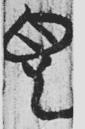見
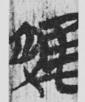○（脽）
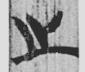之
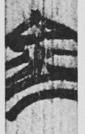倉（寒）
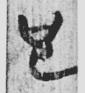也
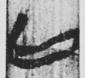㠯
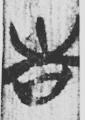告
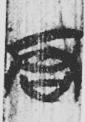君
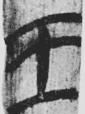王
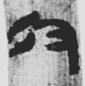今
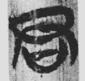君
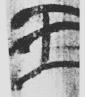王
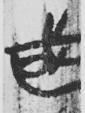或
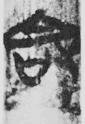命（令）
